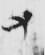又（有）
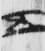五
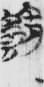○（蓋）
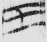王
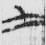士
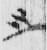之
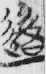○（後）
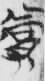賞
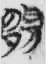○（間）
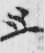之
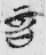言
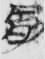{胃刀}（謂）
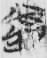番
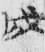戌
